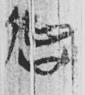佝
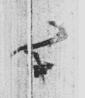氏（是）
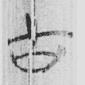古（故）
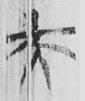夫
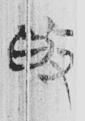敀
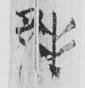邦
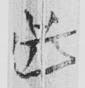甚
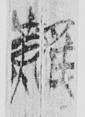難
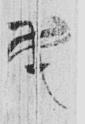民
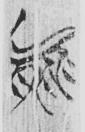能
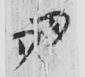多
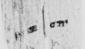一
